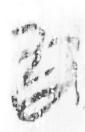旬
